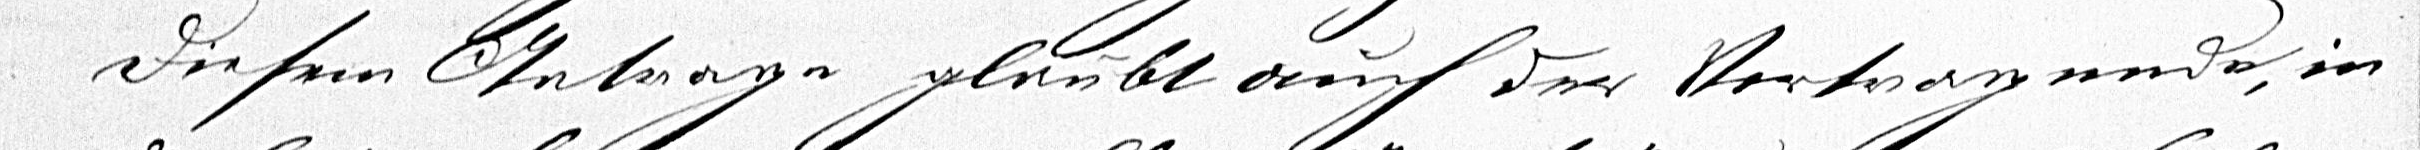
Diesem Antrage glaubt auch der Vertragende, in
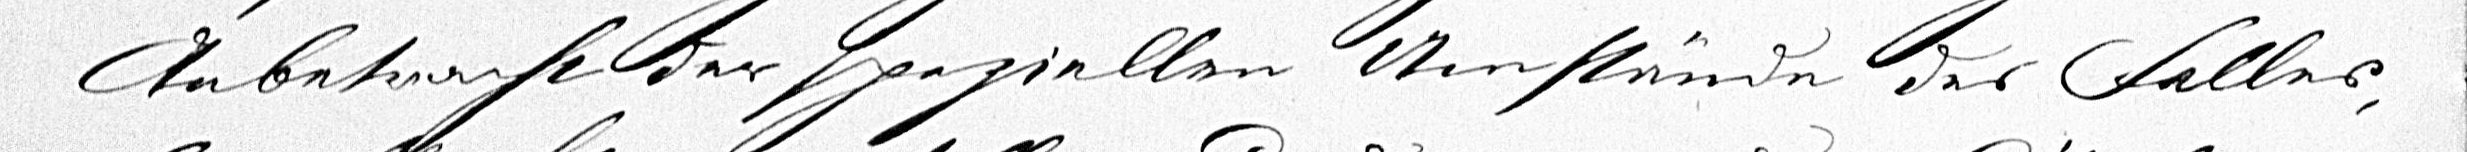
Anbetracht der speziellen Umstände des Falles,
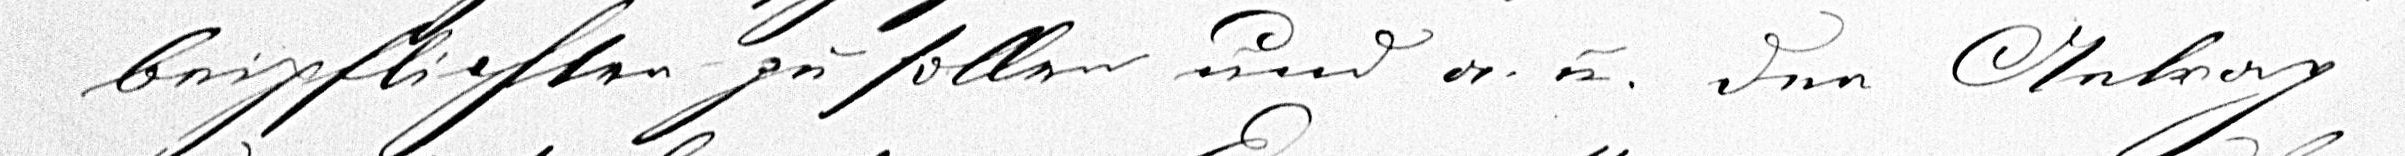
beipflichten zu sollen und a. u. den Antrag
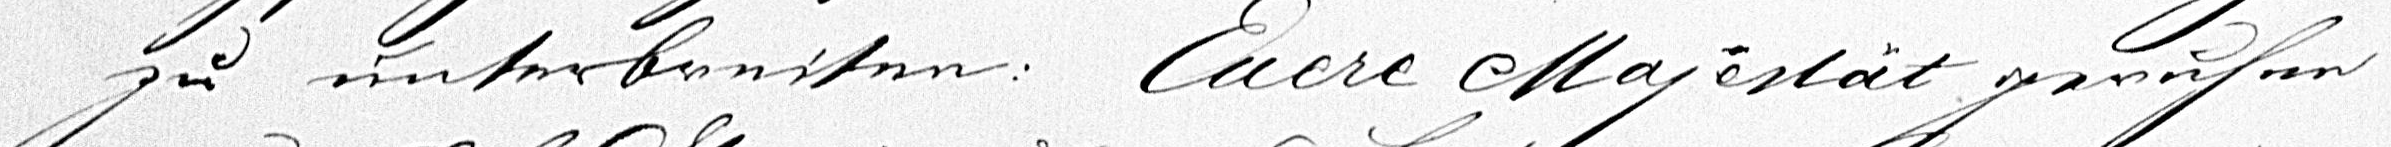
zu unterbreiten: Euere Majestät gerufen
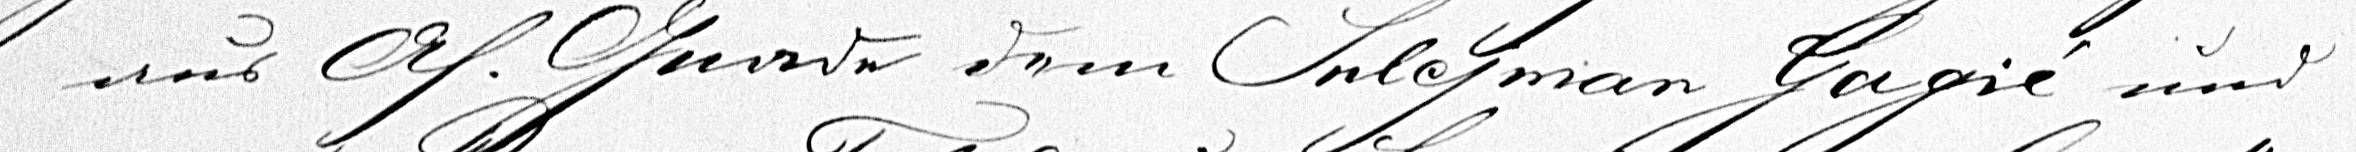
aus Ah. Gnade dem Sulejman Gagić und
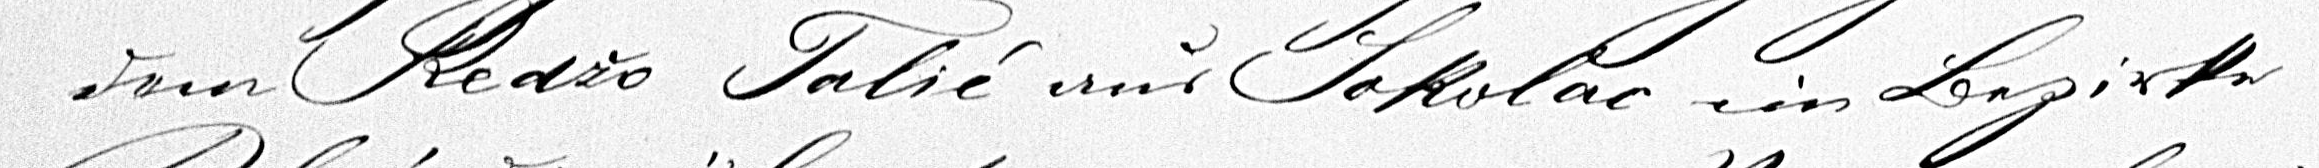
dem Redžo Talić und Sokolac im Bezirke
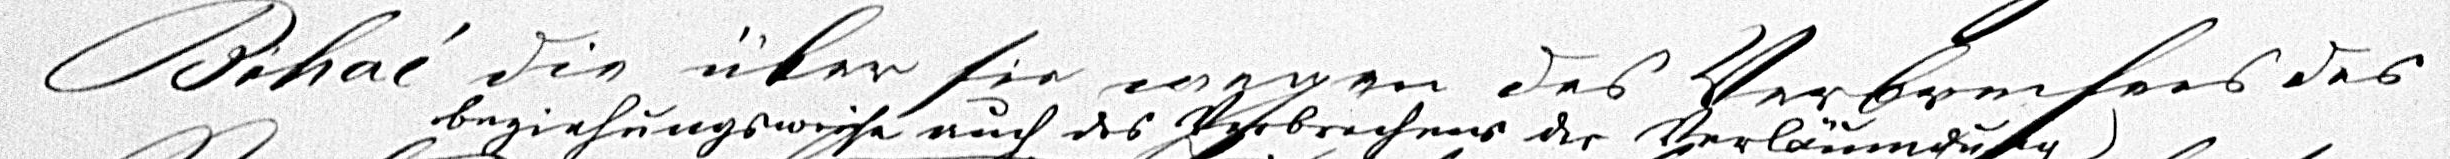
Bihać die über sie wegen des Verbrechers des
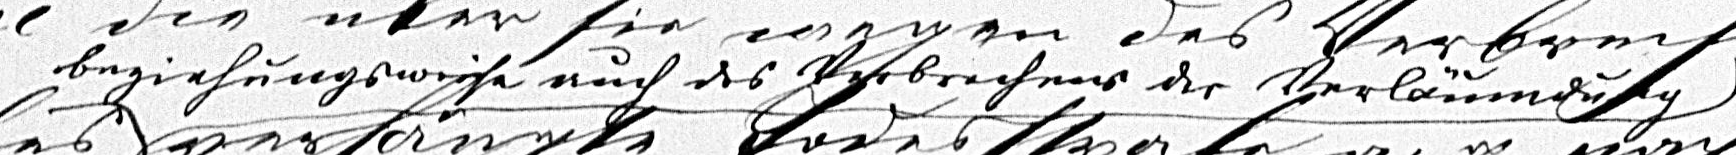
Beziehungswiese auch des Verbrechens der Verläumdung
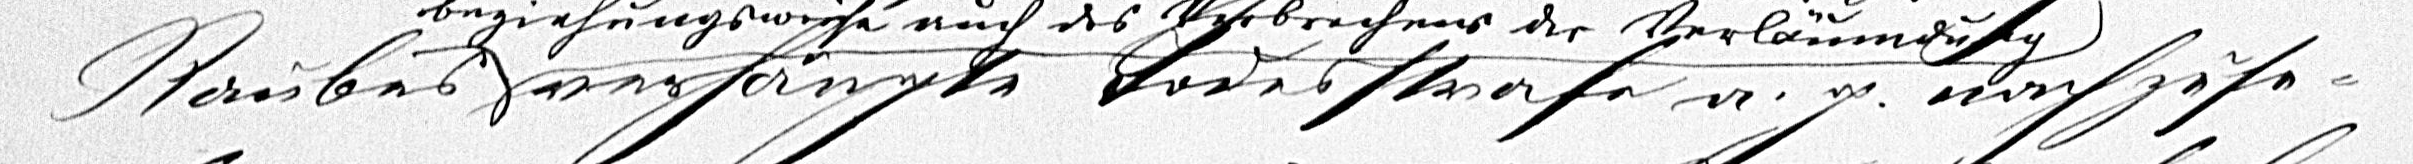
Staubes verhängte Todesstrafe a. p. nachzuse¬
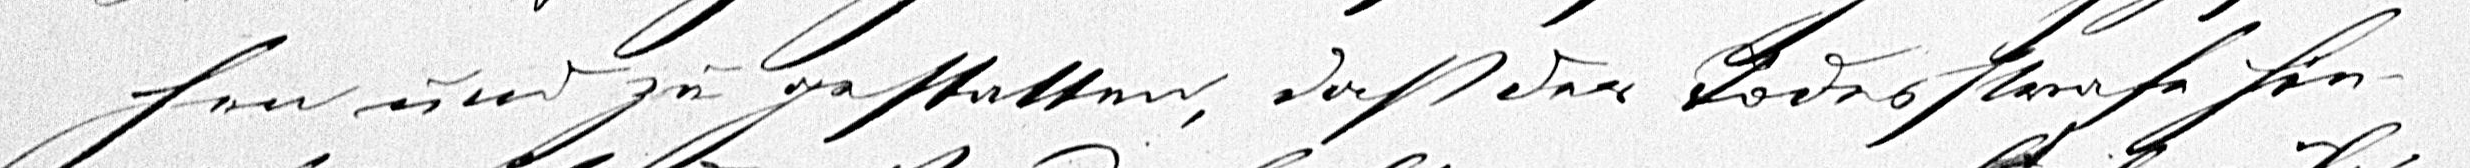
hen und zu gestatten, daß der Todesstrafe hin¬
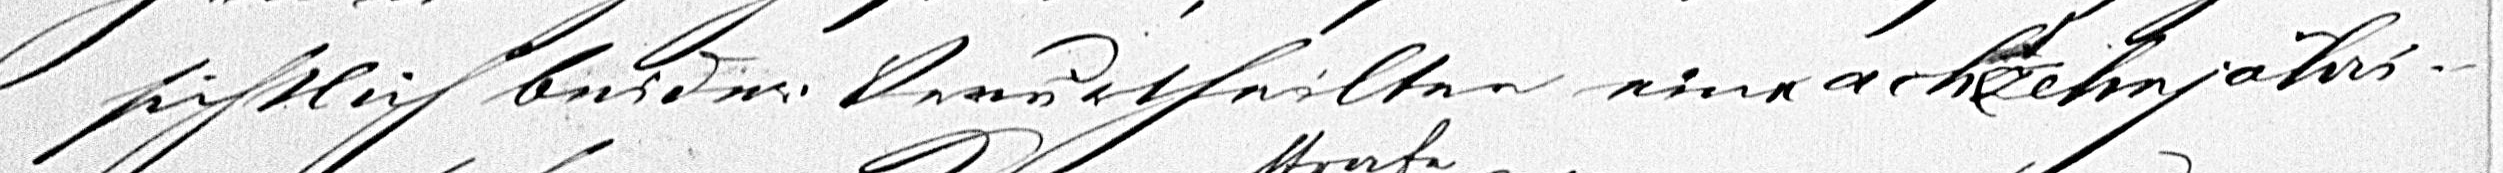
sichtlich beider Verurtheilten eine achtzehn jähri¬
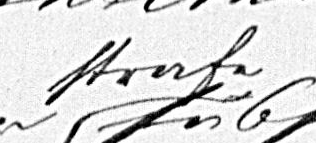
strafe
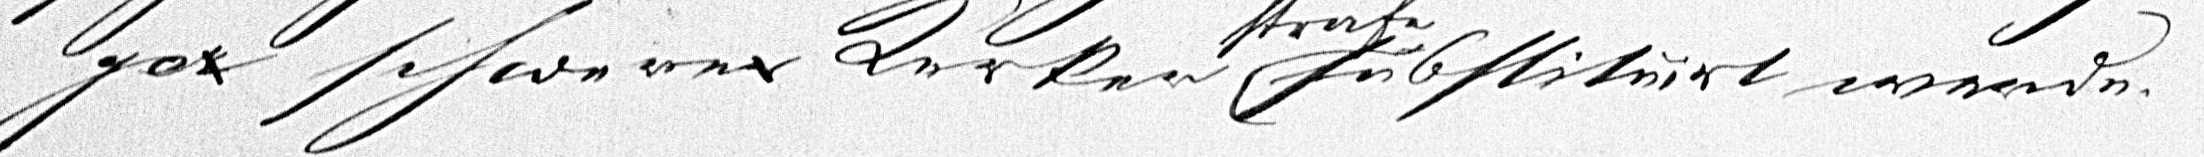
ge schwere Kerker substituirt werde.
